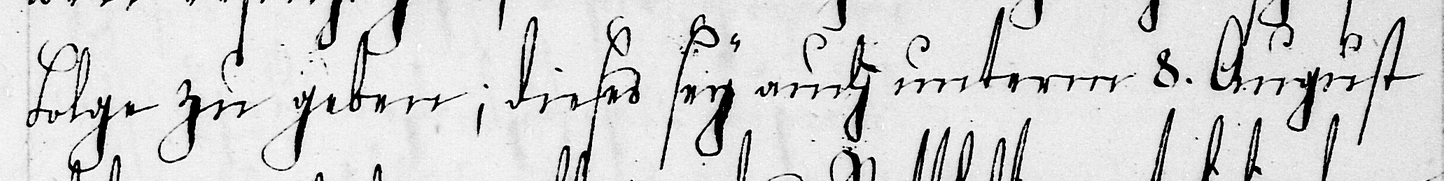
Folge zu geben; dieses sey auch unterm 8. August
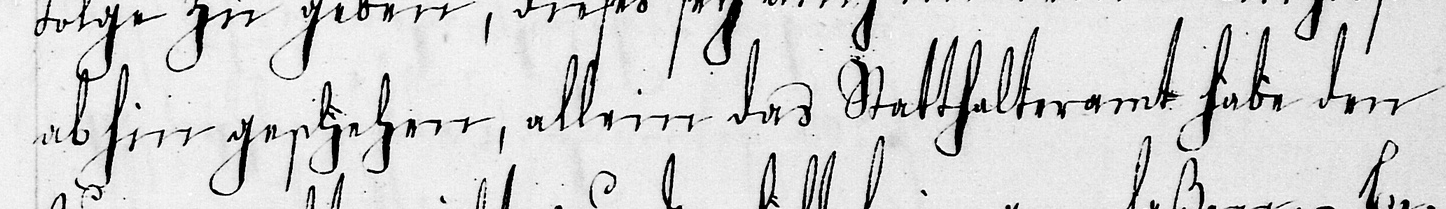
abhin geschehen, allein das Statthalteramt habe den
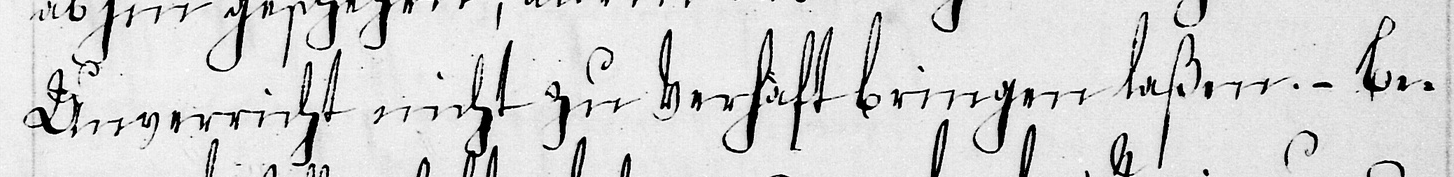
Unverricht nicht zu Verhaft bringen laßen. – Be¬
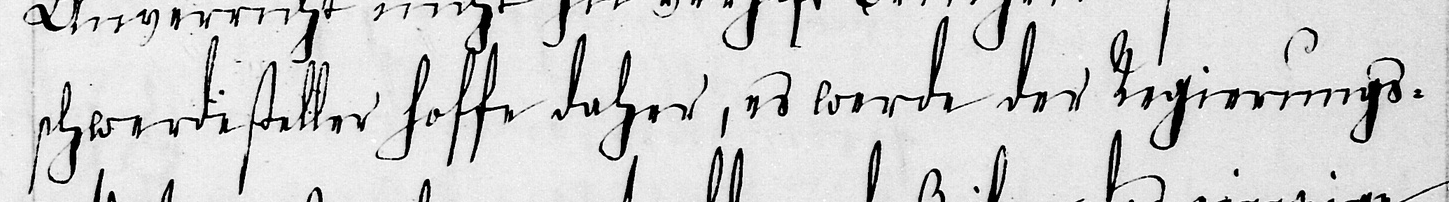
schwerdesteller hoffe daher, es werde der Regierungs¬
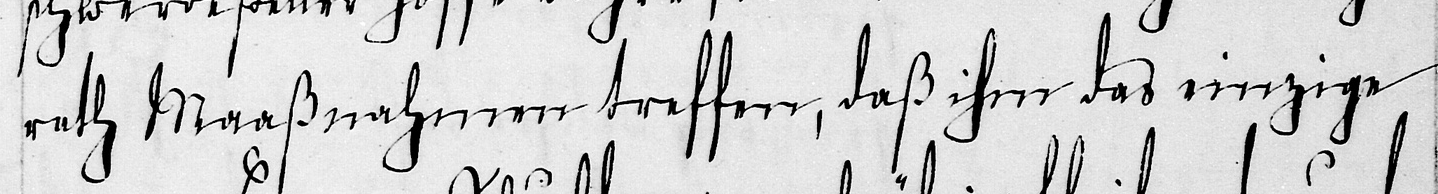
rath Maaßnahmen treffen, daß ihm das einzige
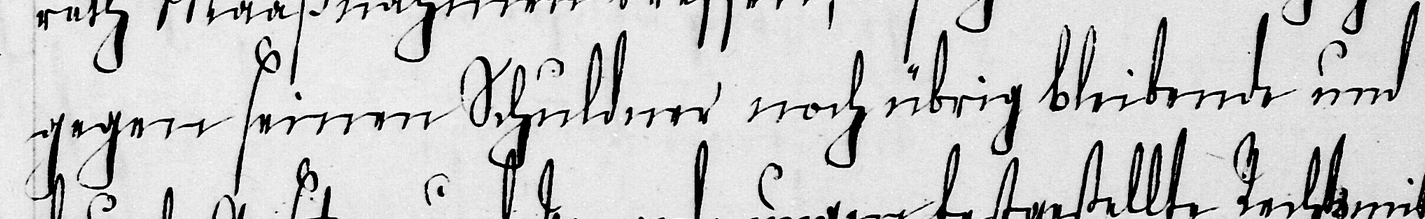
gegen seinen Schuldner noch übrig bleibende und
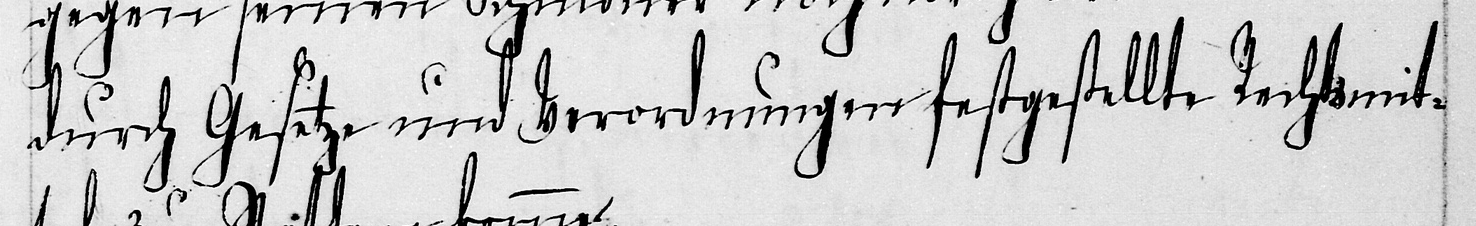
durch Gesetze und Verordnungen festgestellte Rechtsmit¬
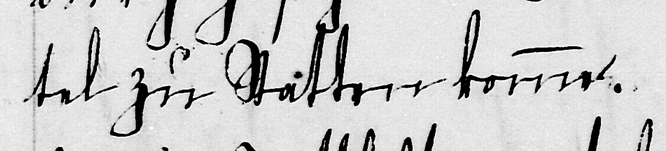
tel zu Staaten komme.
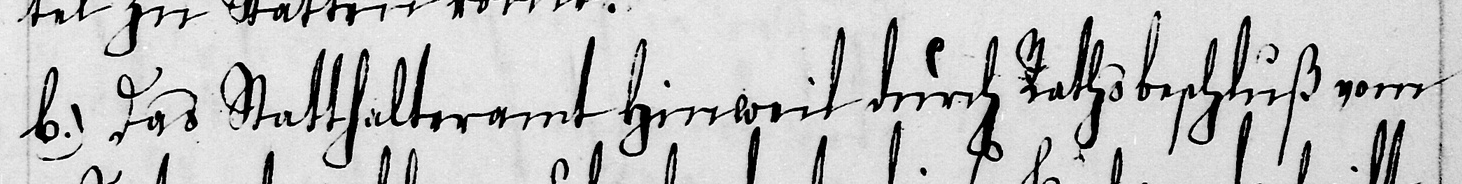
b.) Das Statthalteramte Hinweil durch Rathsbeschluß vom
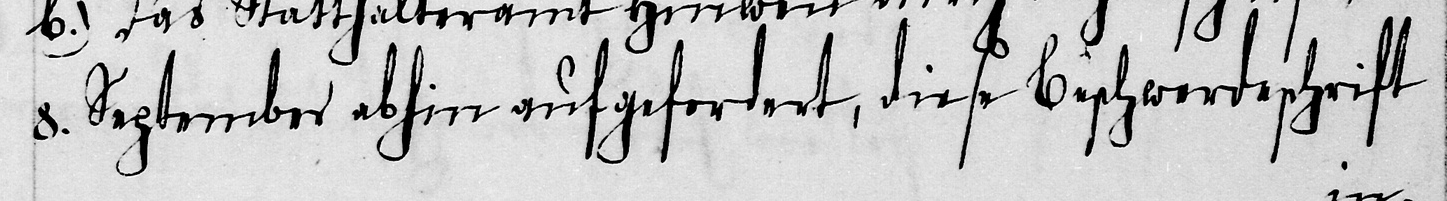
8. September abhin aufgefordert, diese Beschwerdeschrift
